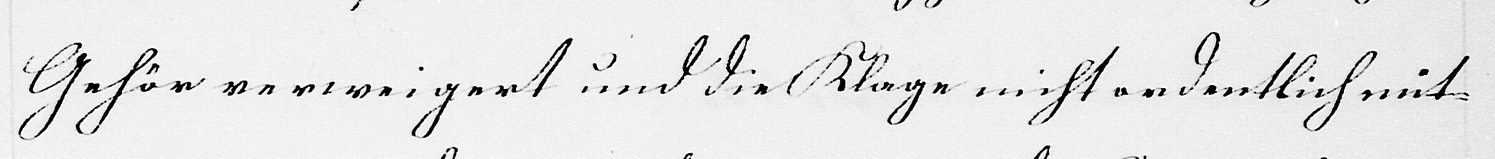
Gehör verweigert und die Klage nicht ordentlich mit¬
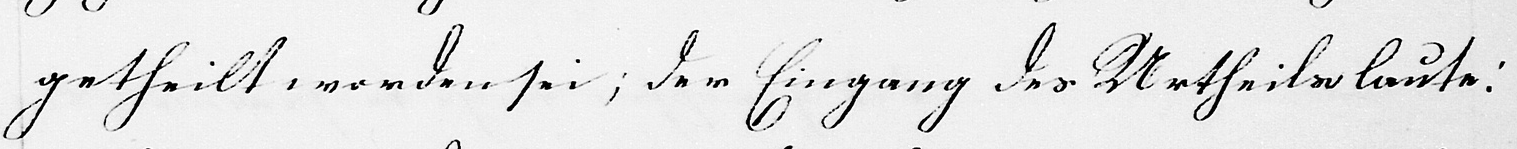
getheilt worden sei; der Eingang des Urtheils laute:
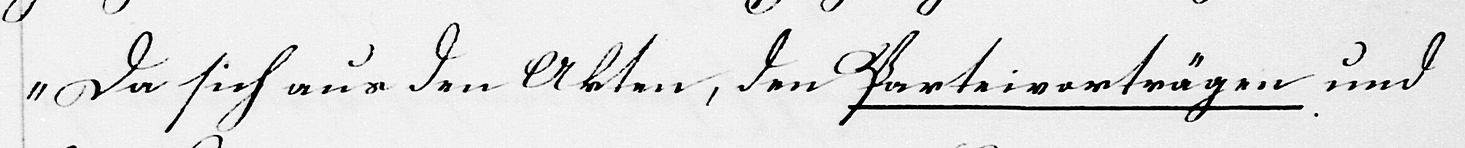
„Da sich aus den Akten, den Parteivorträgen und
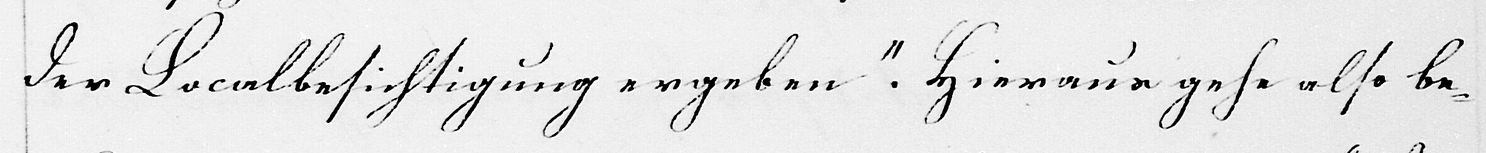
der Localbesichtigung ergeben“. Hieraus gehe also be¬
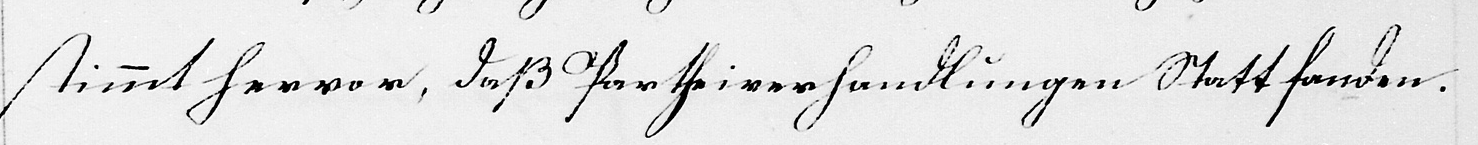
stimmt hervor, daß Partheiverhandlungen Statt fanden.
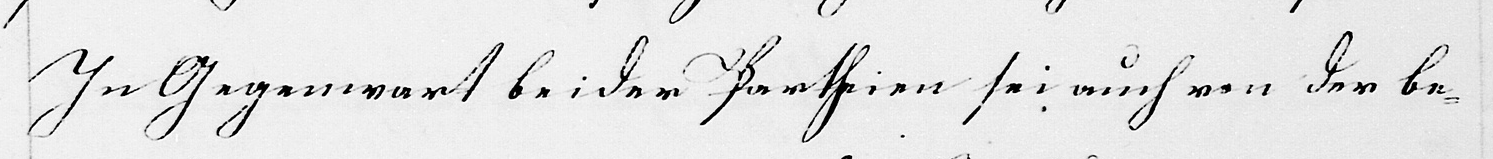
In Gegenwart beider Partheien sei auch von der be¬
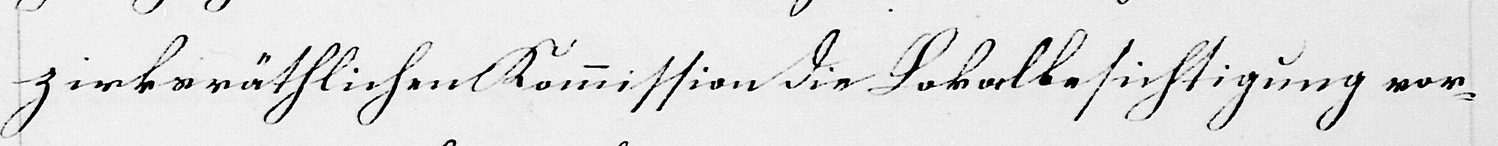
zirksräthlichen Kommission die Lokalbesichtigung vor¬
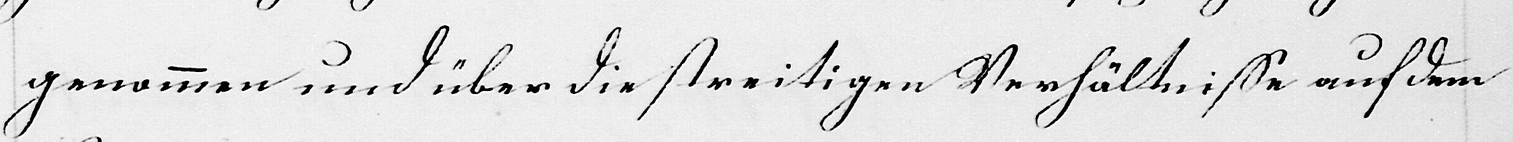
genommen und über die streitigen Verhältniße auf dem
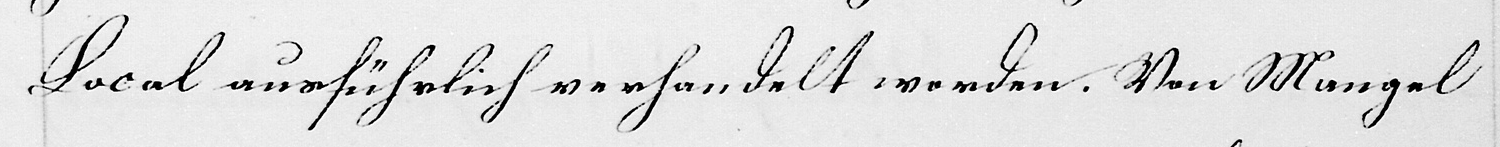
Local ausführlich verhandelt worden. Von Mangel
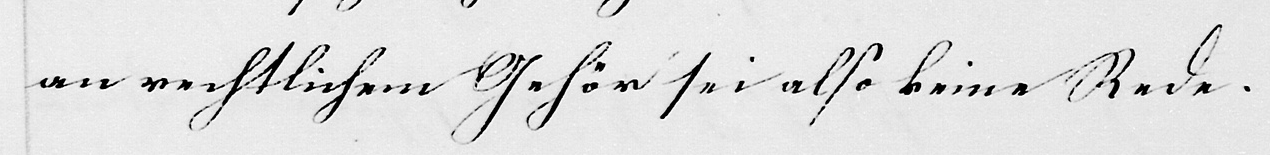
an rechtlichem Gehör sei also keine Rede.
